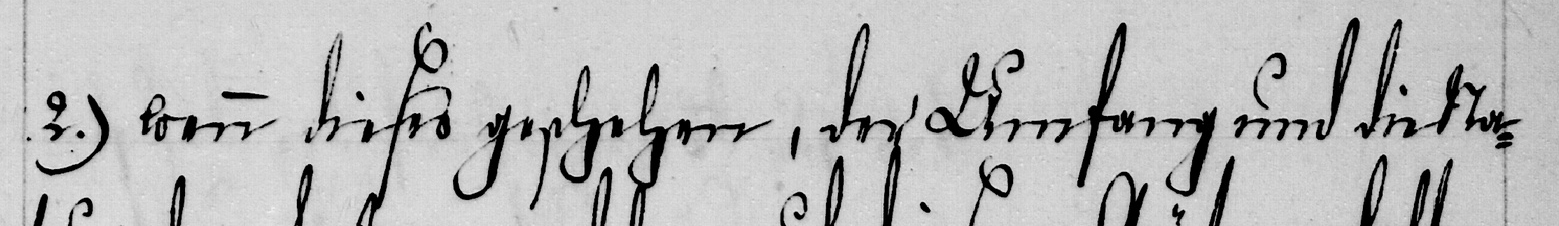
2.) wenn dieses geschehen, der Umfang und die Na¬
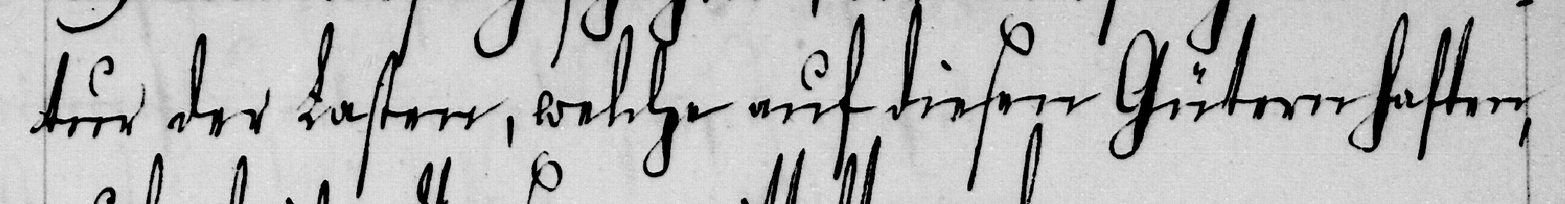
tur der Lasten, welche auf diesen Gütern haften,
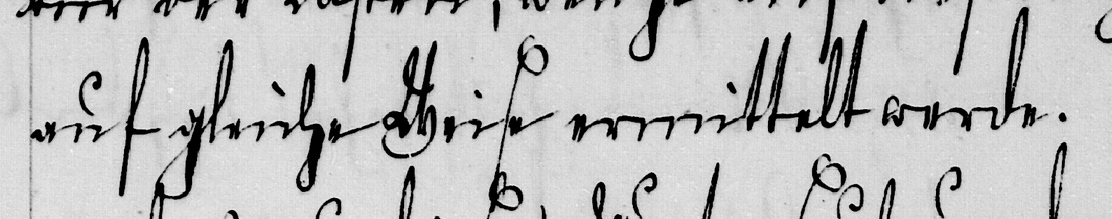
auf gleiche Weise ermittelt werde.
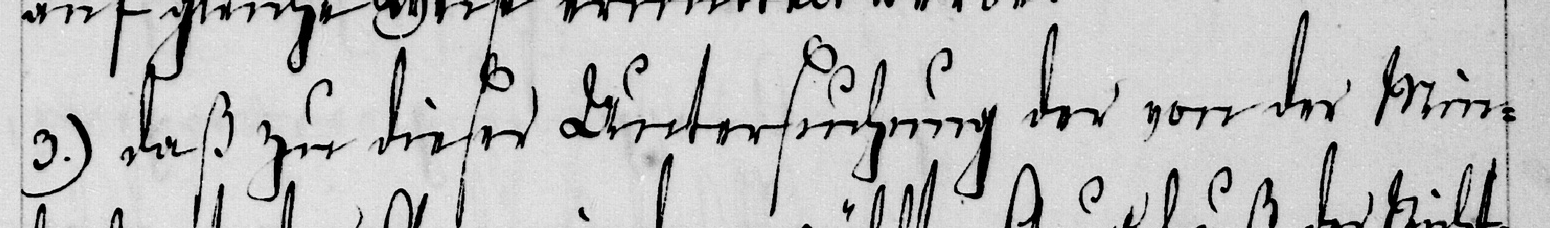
3.) daß zu dieser Untersuchung der von der Min¬
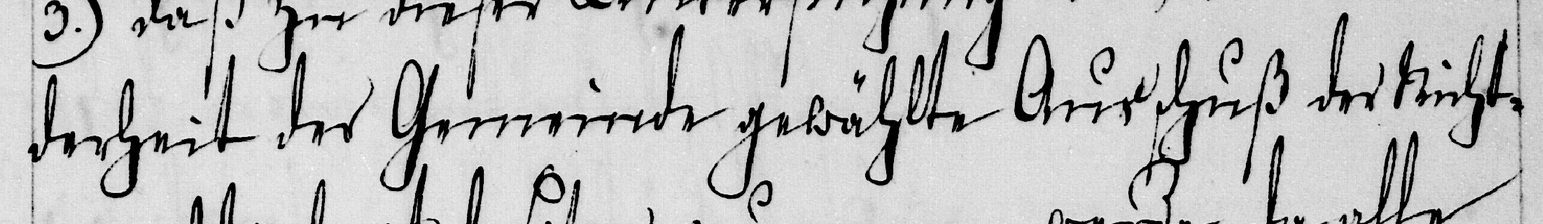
derheit der Gemeinde gewählte Ausschuß der Nicht¬
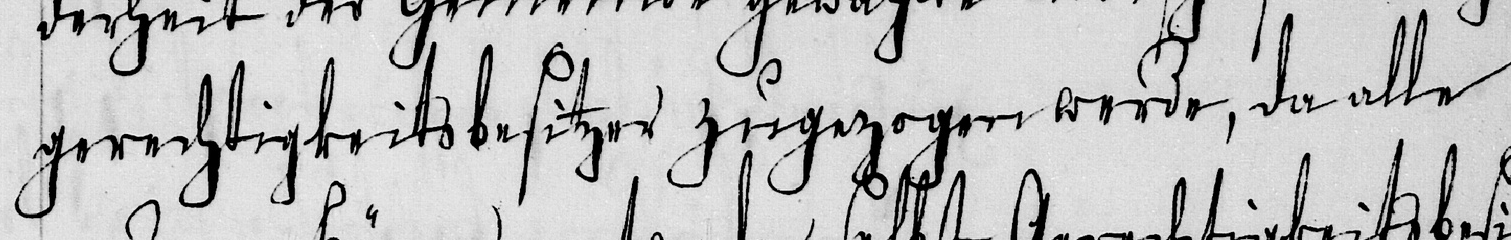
gerechtigkeitsbesitzer zugezogen werde, da alle
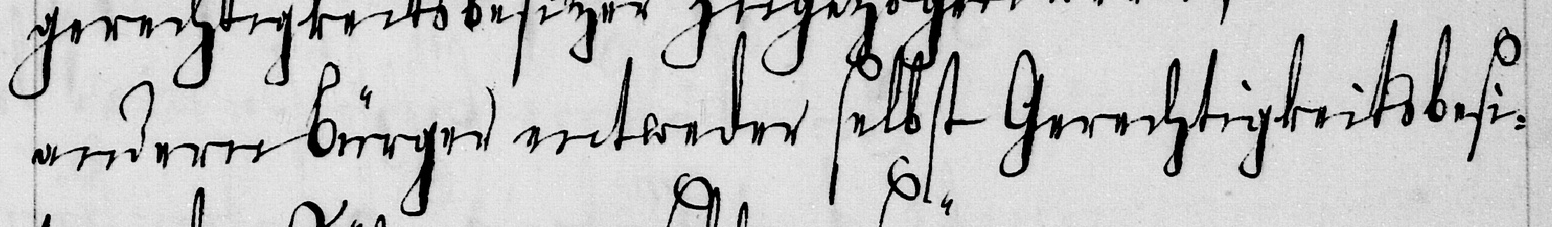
andern Bürger entweder selbst Gerechtigkeitsbesi¬
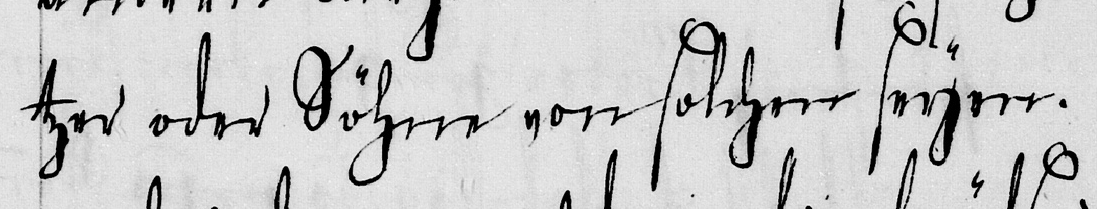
tzer oder Söhne von solchen seyen.
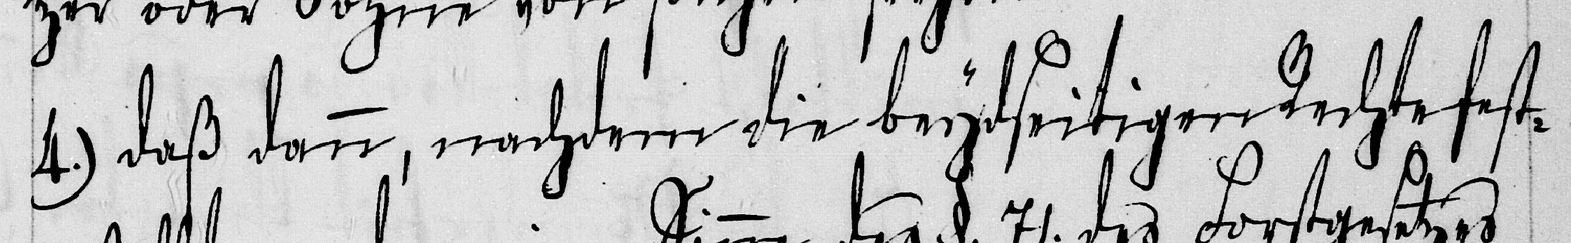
4.) daß dann, nachdem die beydseitigen Rechte fe¬
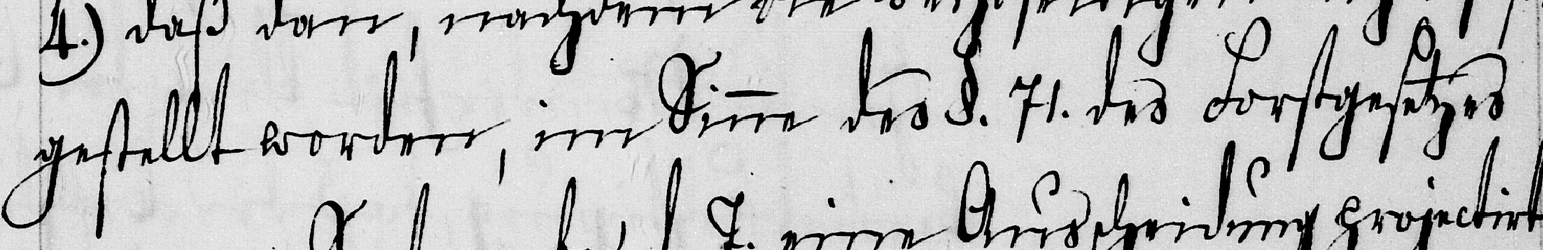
gestellt worden, im Sinne des §. 71. des Forstgesetzes
